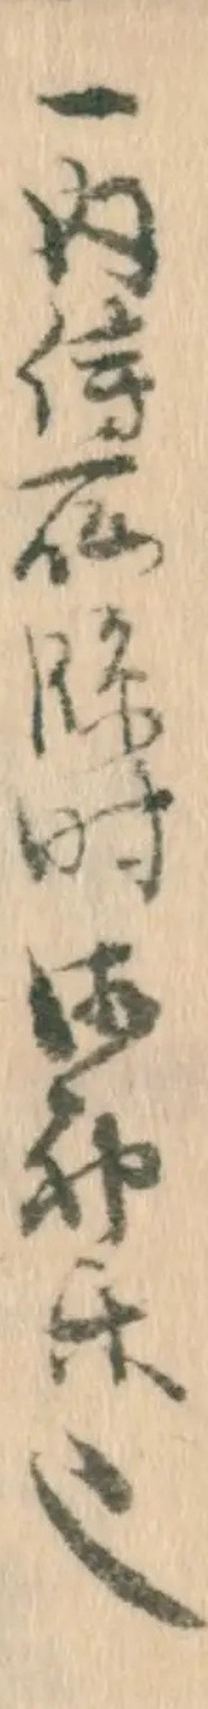一内侍所臨時御神楽也
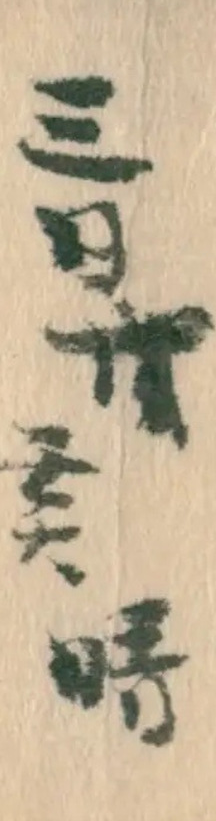三日丁亥晴
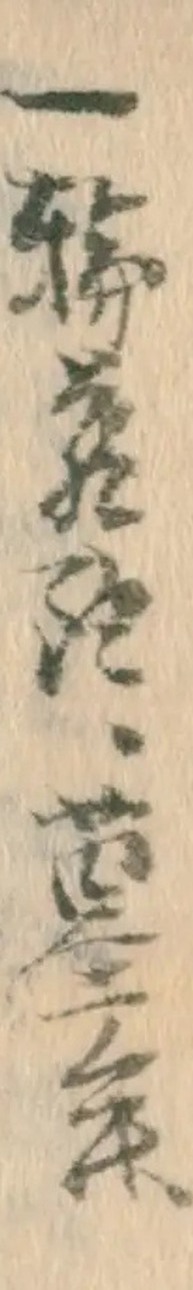一輪蔵院へ墓参
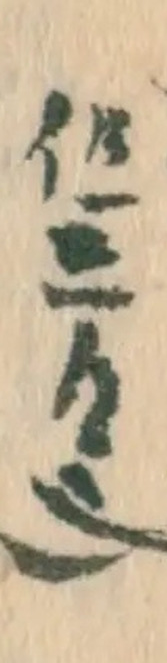但三匁也
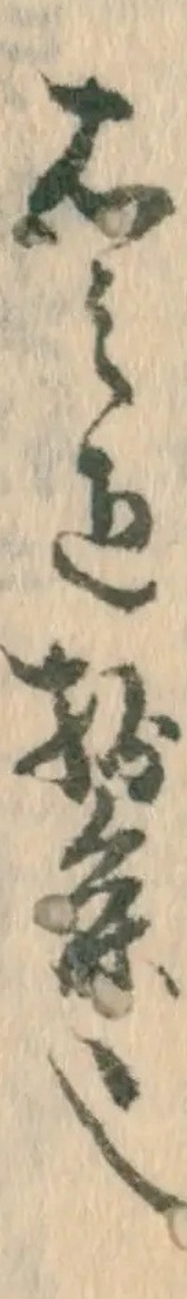右之通持参也
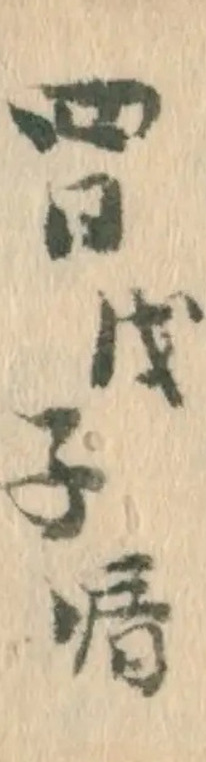四日戊子晴

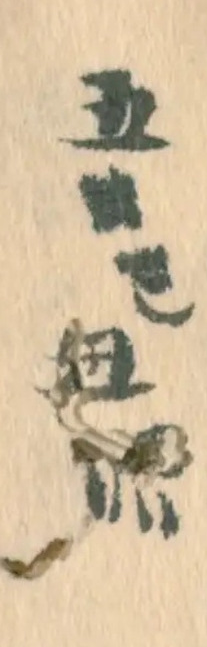五日己丑晴
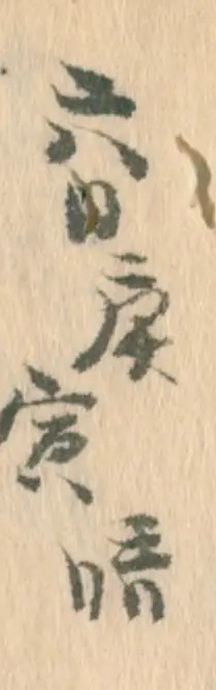六日庚寅晴
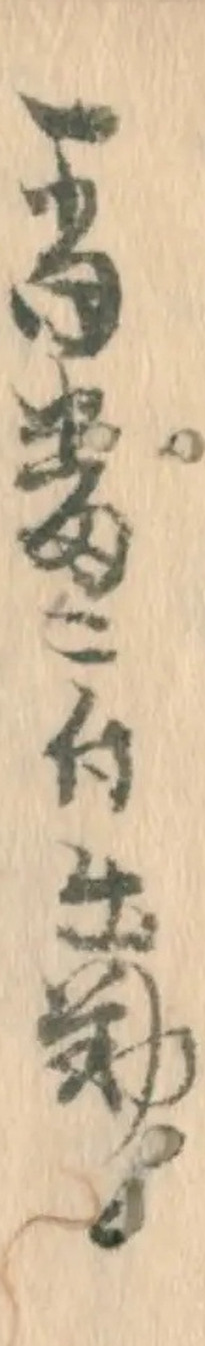一当番ニ付出勤
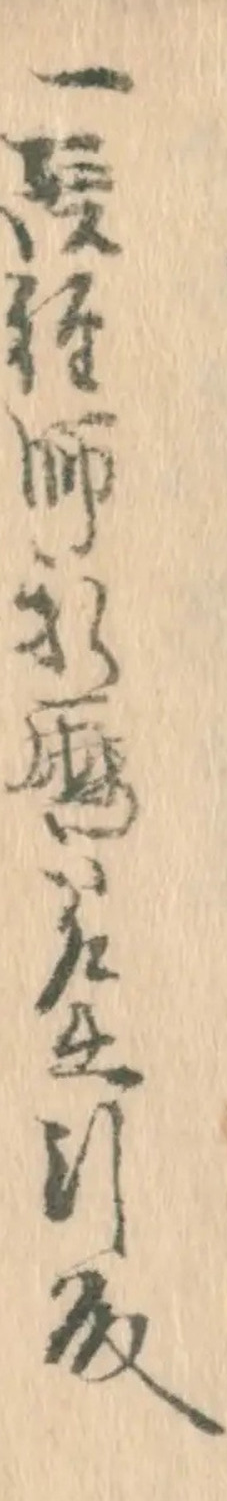一院経師新暦差出引取
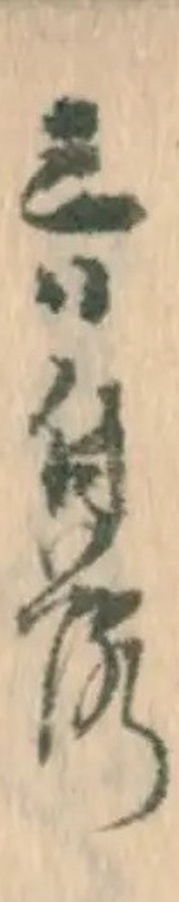三日付落
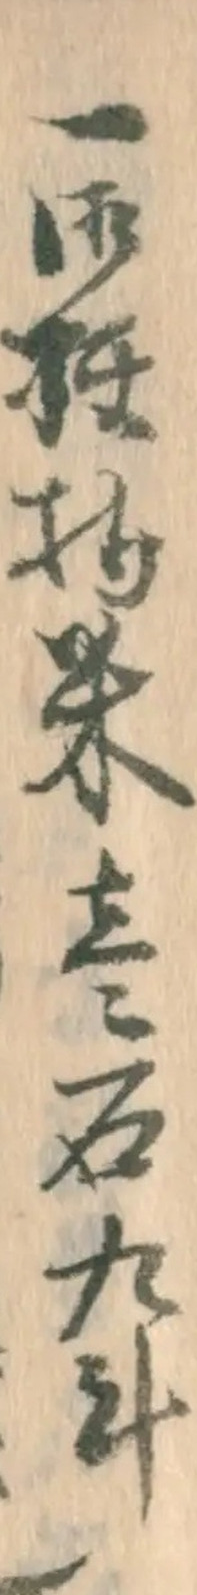一御扶持米壱石九斗
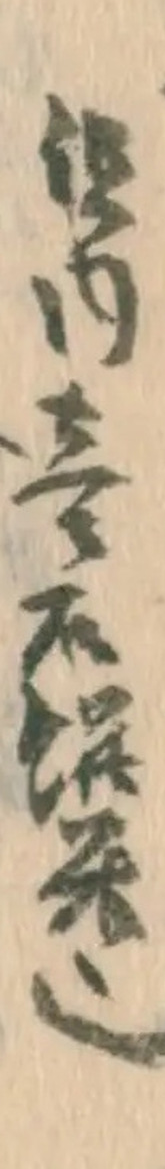但内壱石餅米也
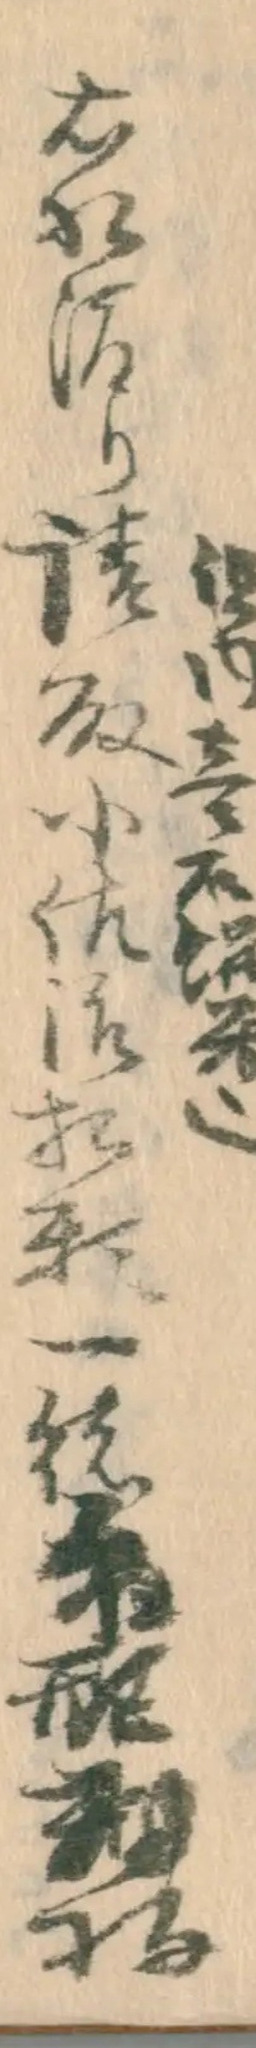右相渡り請取小佐治相頼一緒印形為持
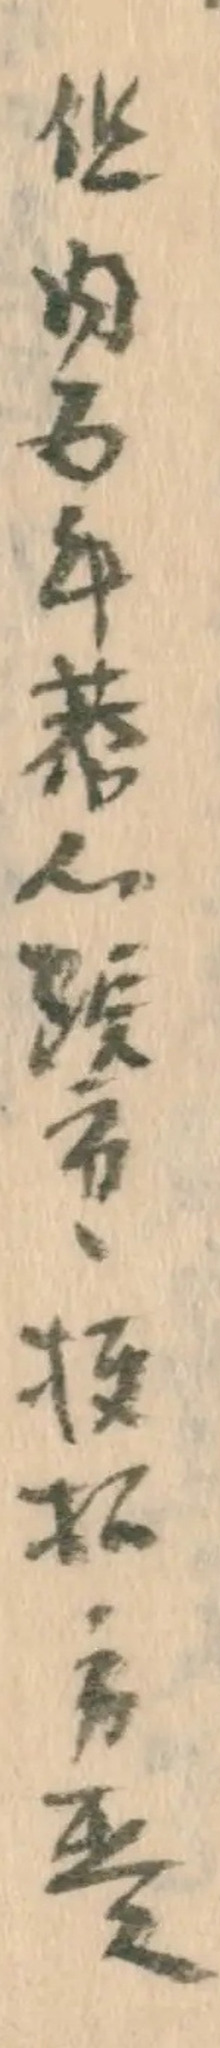但内五斗恭心院方へ扶持方遣ス
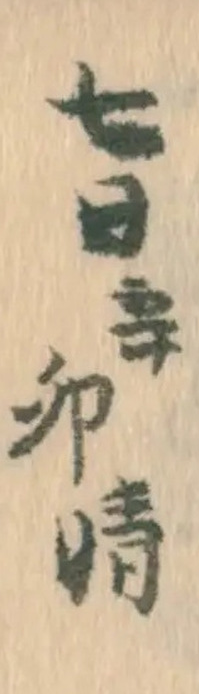七日辛卯晴
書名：禁裏御所御用日記. [131]
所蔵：国立国会図書館 National Diet Library, JAPAN
